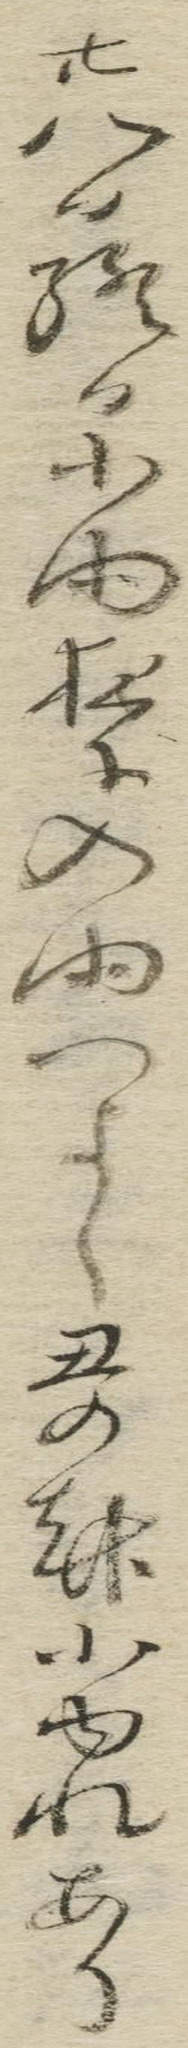廿八日終日小雨夜に入雨つよし丑の刻小ゆれあり
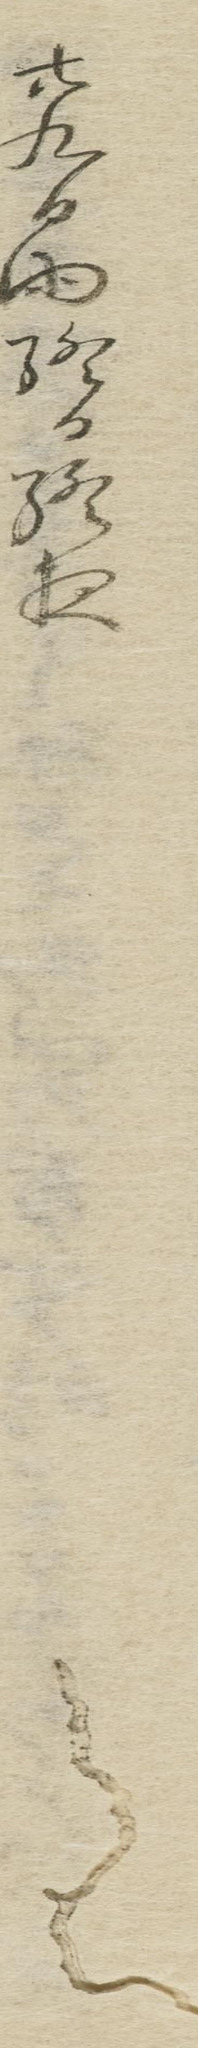廿九日雨終日終夜
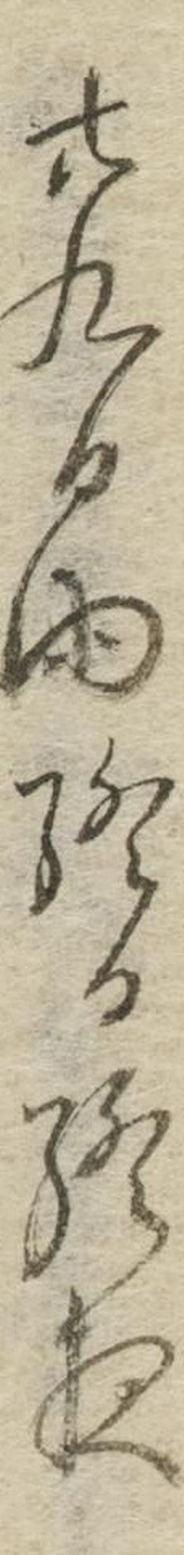廿九日雨終日終夜
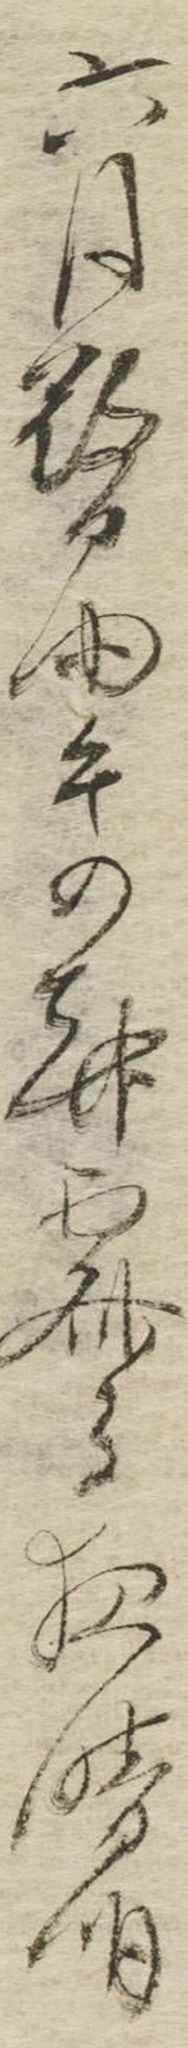六月朔日雨午の刻霽る夜晴明
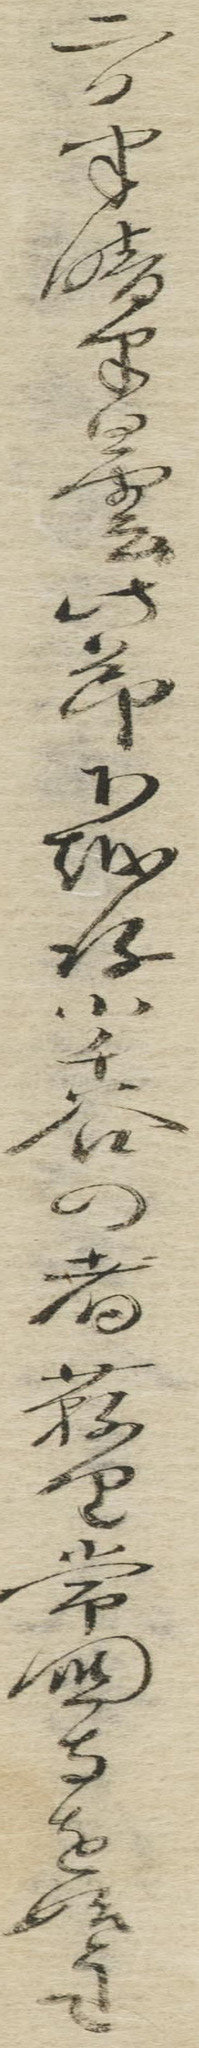二日半晴半曇此節下越後小千谷の者菘里常国守を始として
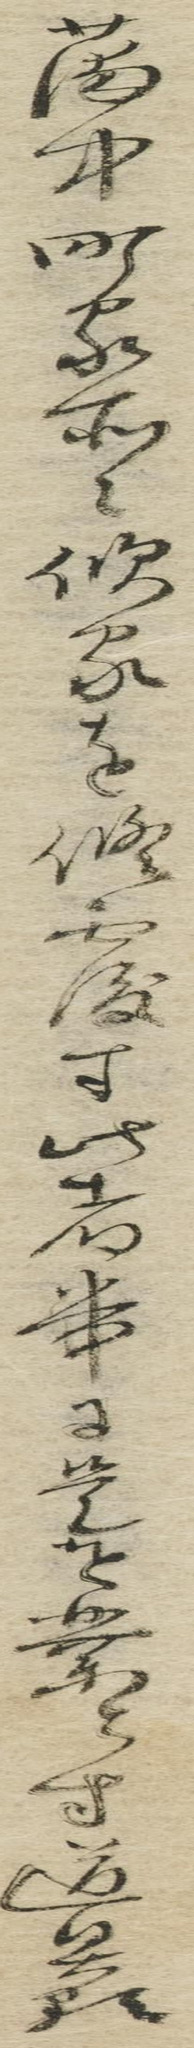藩中町家所々傾家を修復す此者常に是を業とす道具類
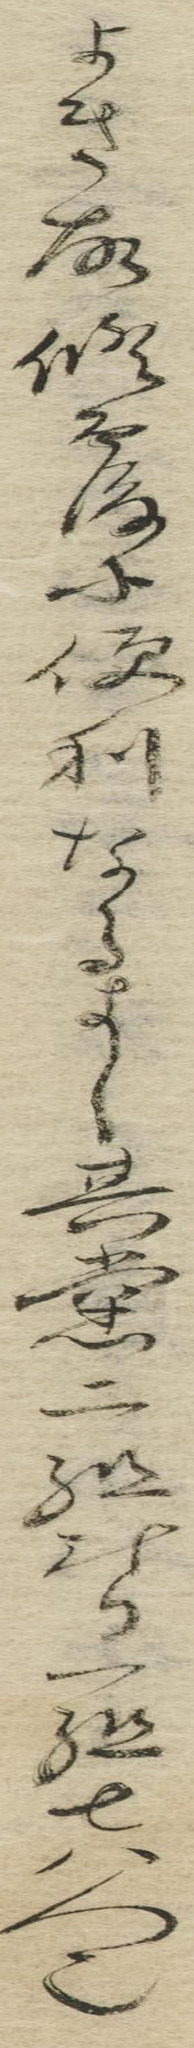よき故修復に便利なるよし其党二組計り一組七八人也

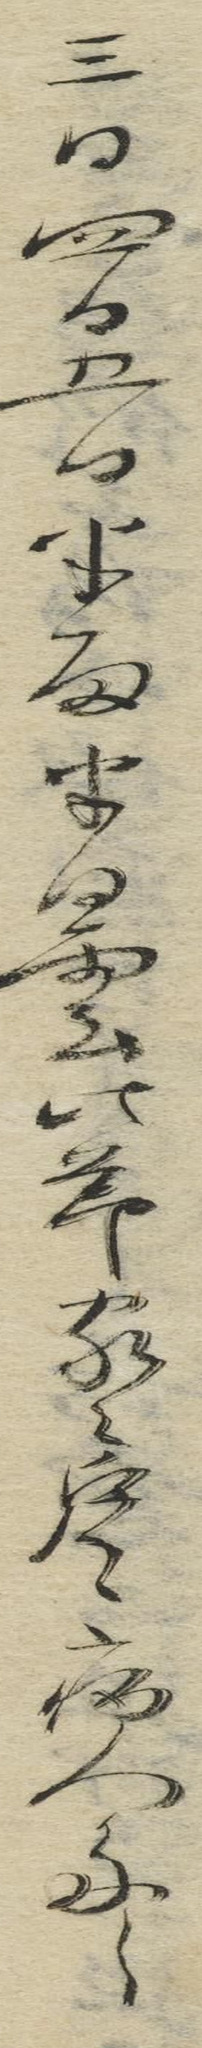三日四日五日半雨半曇此節家々戸々病人多し
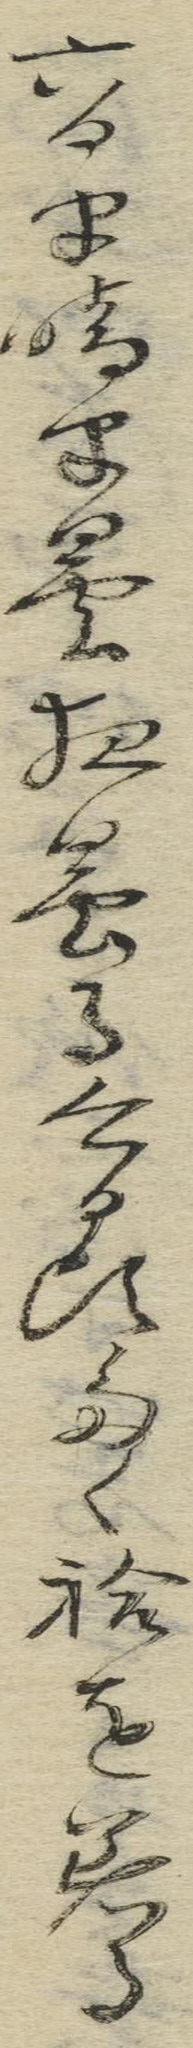六日半晴半曇夜曇る今日頃多く袷を着る
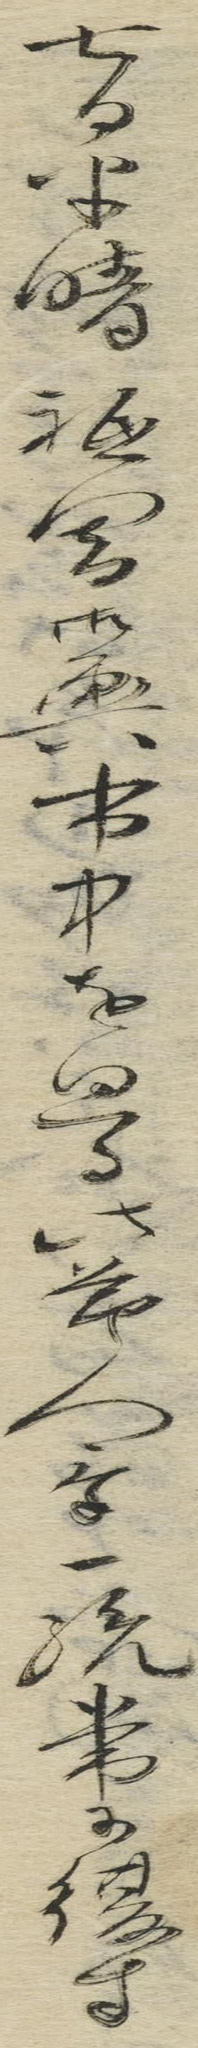七日半晴祇宮御輿市中を廻る此節人気一統常に復す
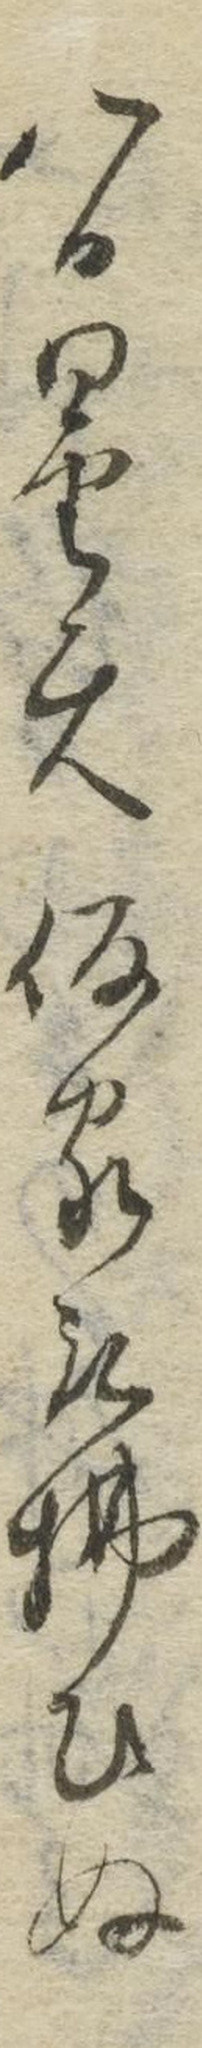八日曇天仮家取払ひぬ
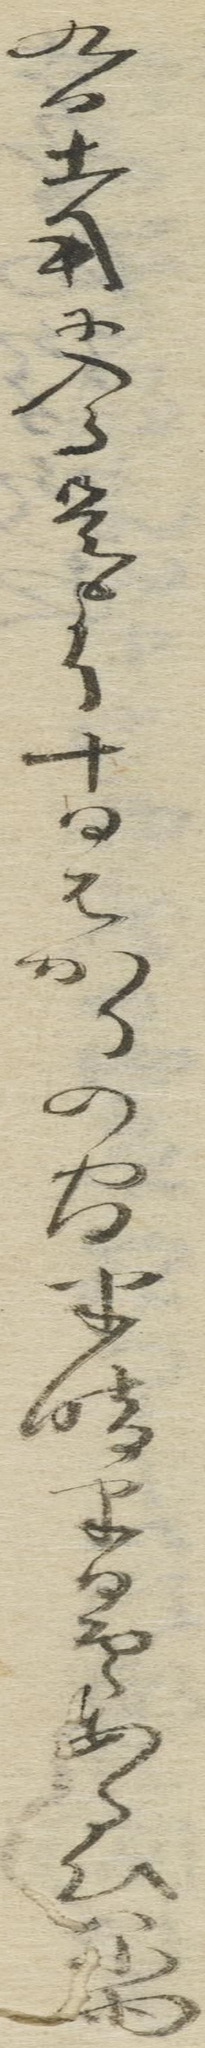九日土用に入る是より十日はかりの間半晴半曇あるひハ小雨
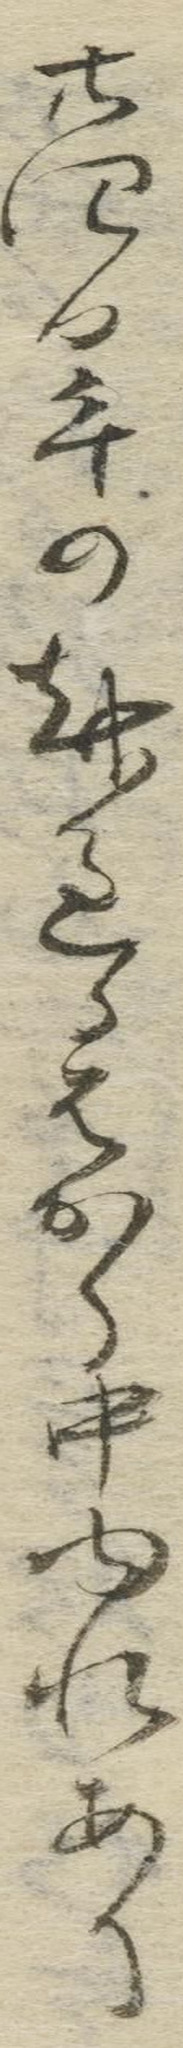廿四日午の刻過はかり中ゆれあり
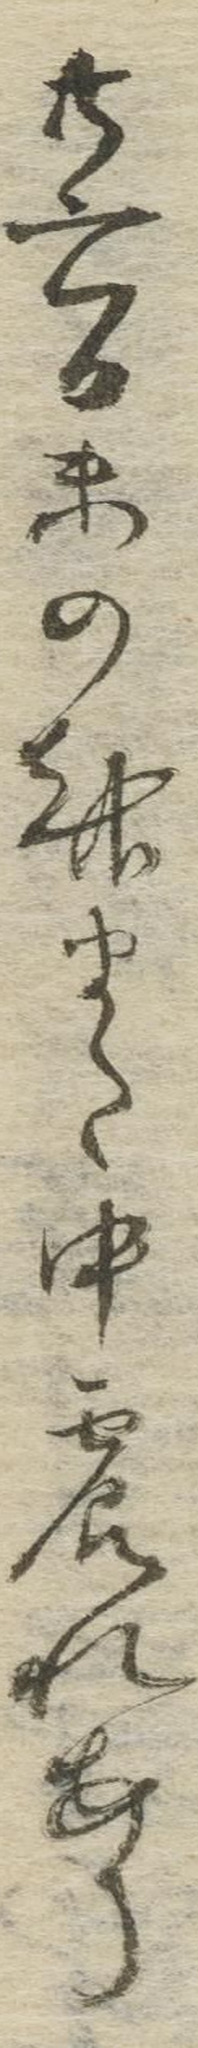廿六日未の刻また中震れあり
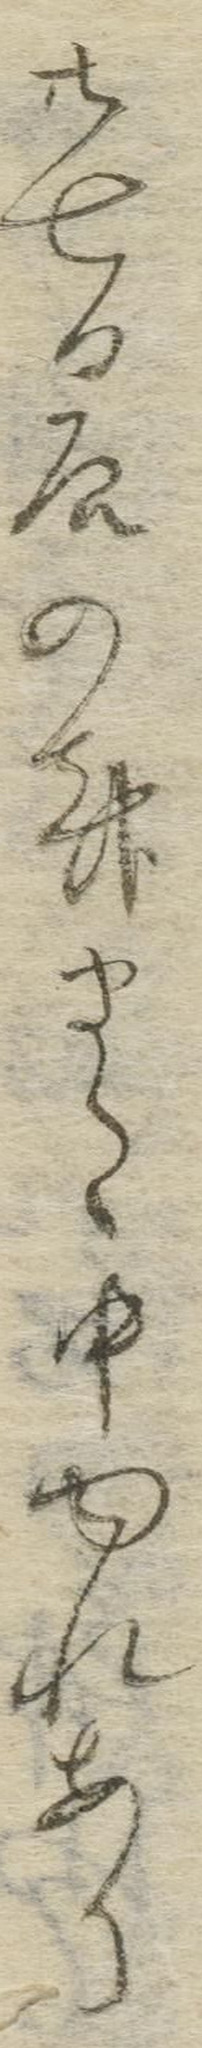廿七日辰の刻また中ゆれあり
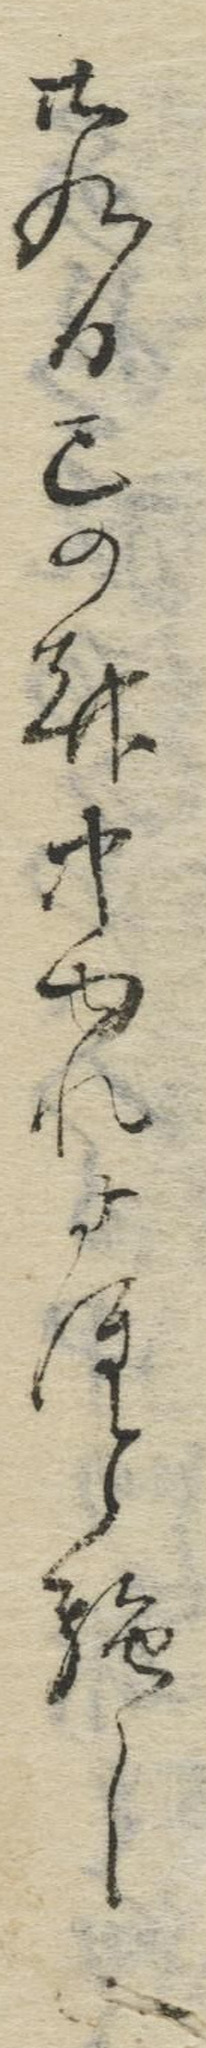廿九日巳の刻中ゆれよほと強し
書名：弘化丁未天變日記
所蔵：東京大学地震研究所図書室 Earthquake Research Institute Library, The University of Tokyo, JAPAN
